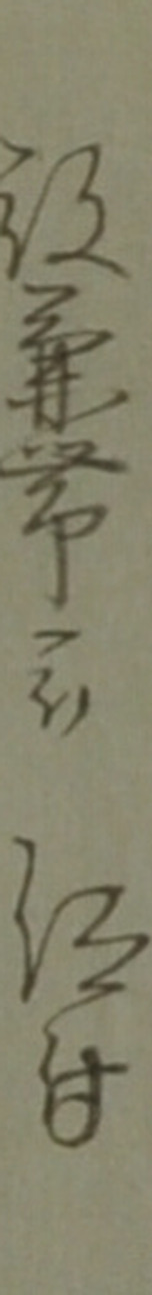役兼帯被仰付
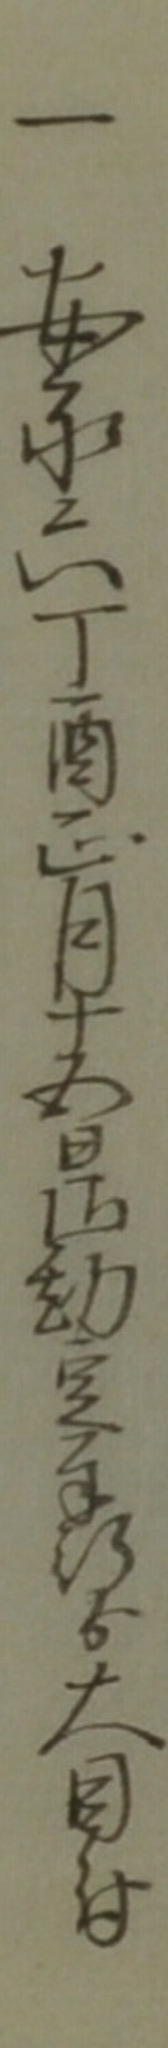一安永六丁酉正月十五日御勘定奉行ゟ大目付
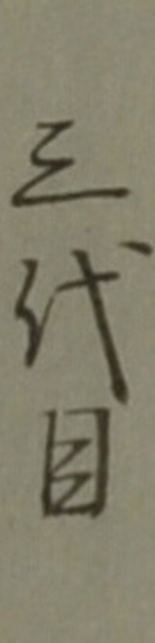三代目
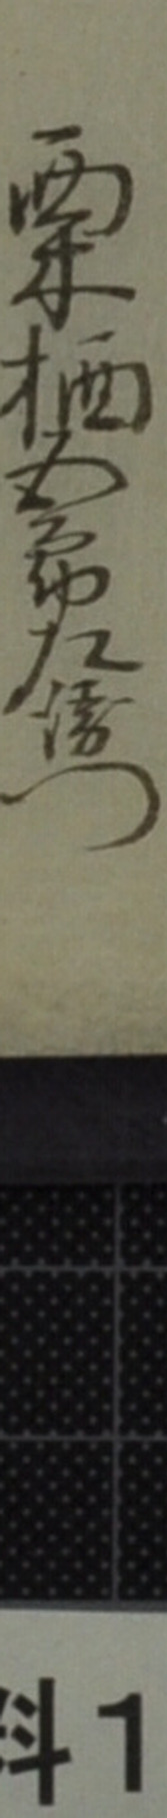栗栖五郎左衛門
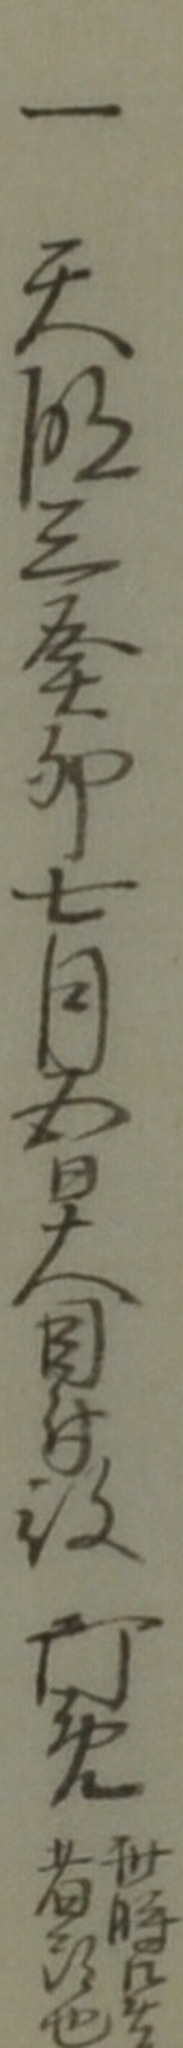一天明三癸卯七月五日大目付役御免此時御先手
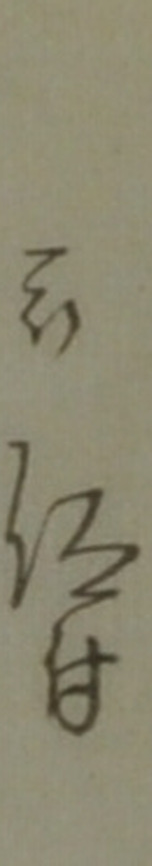被仰付
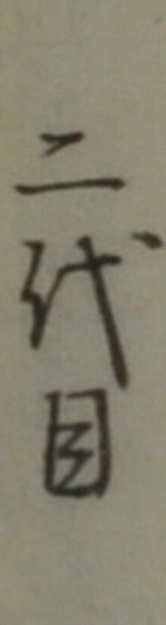二代目
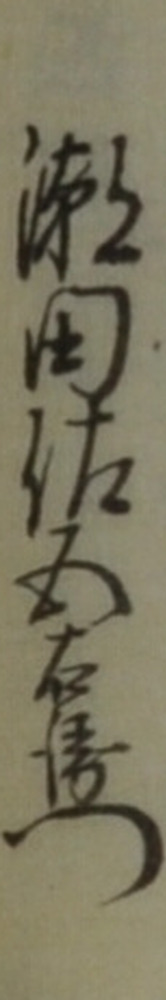瀬田佐五右衛門
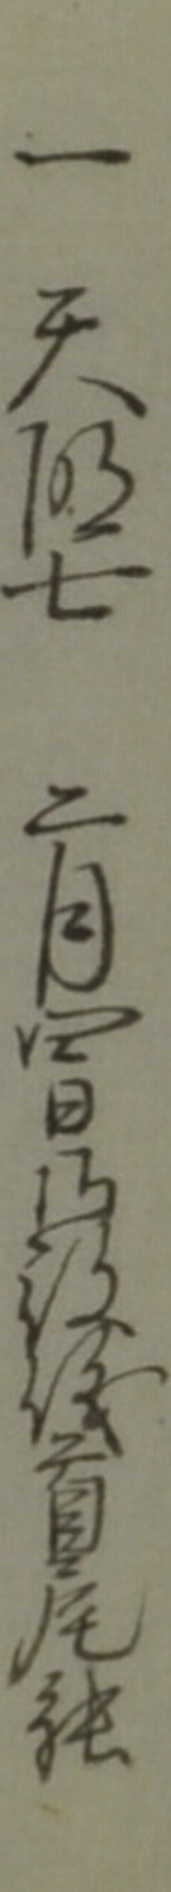一天明七二月四日御役儀首尾能
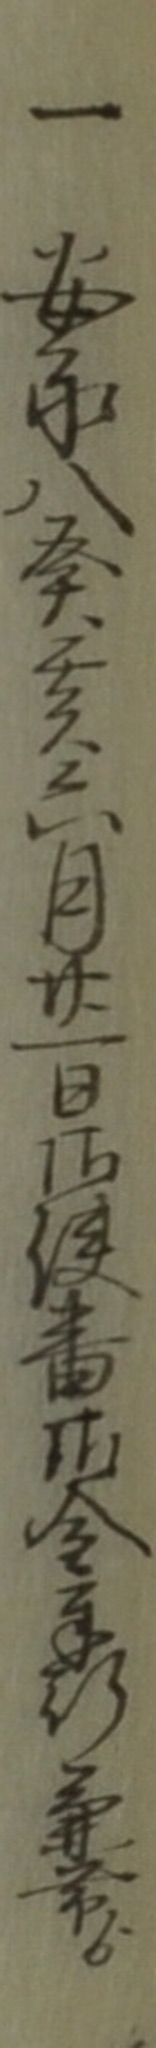一安永八癸亥六月廿一日御使番御金奉行兼帯ゟ
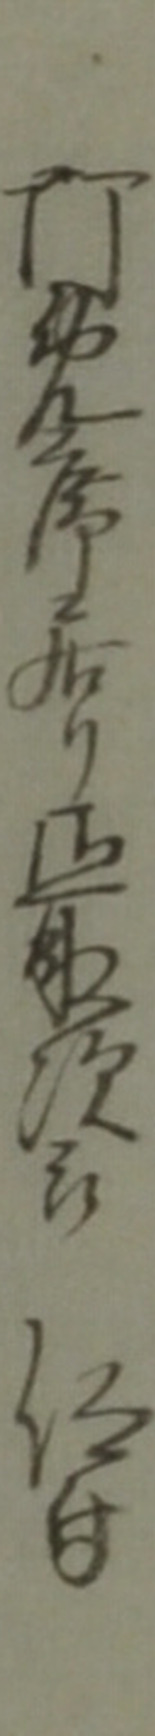御免席居り御取次被仰付
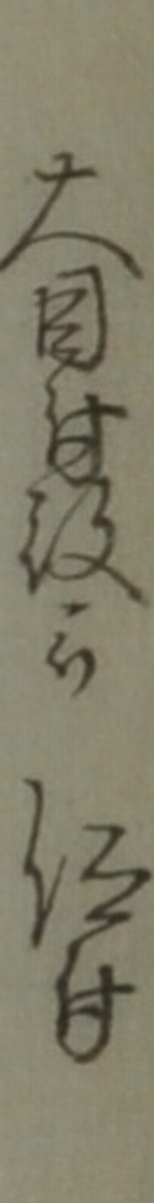大目付役被仰付
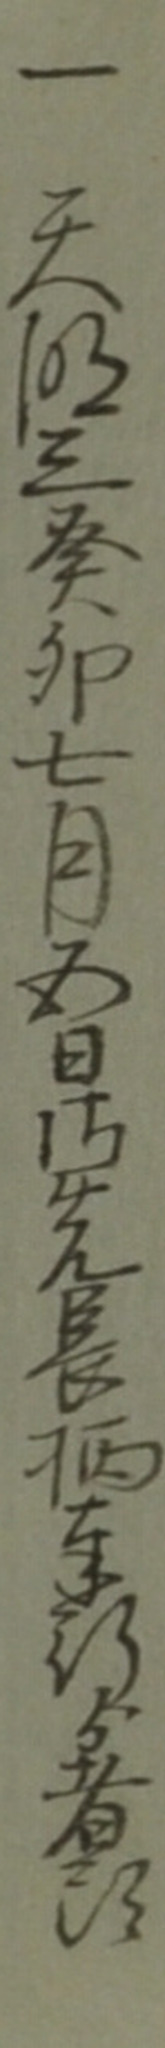一天明三癸卯七月五日御先長柄奉行ゟ者頭
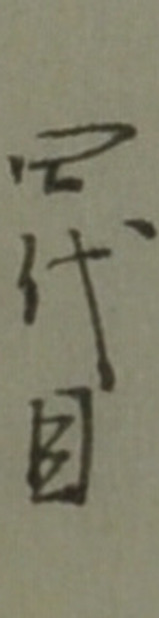四代目
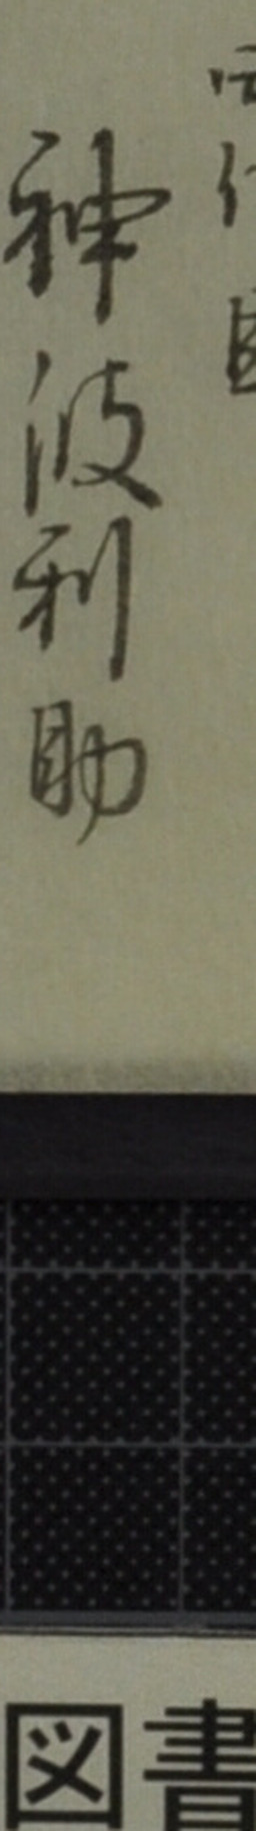神波利助
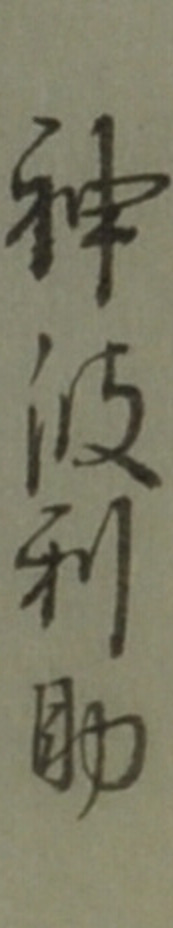神波利助
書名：諸御役代々録（三）
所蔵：伊那市立高遠町図書館・合同会社AMANE
